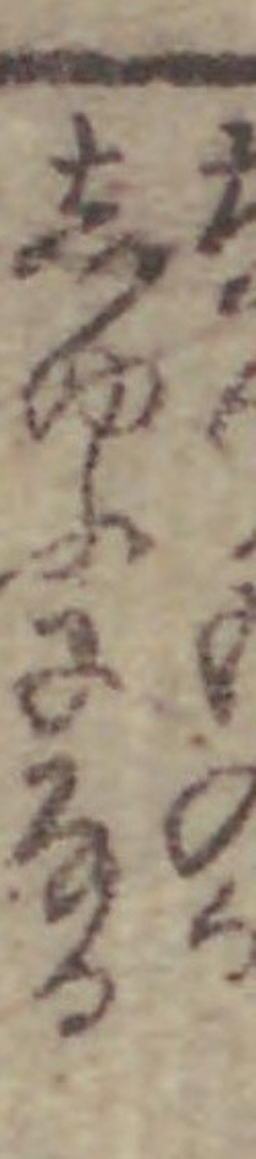しゆふになる
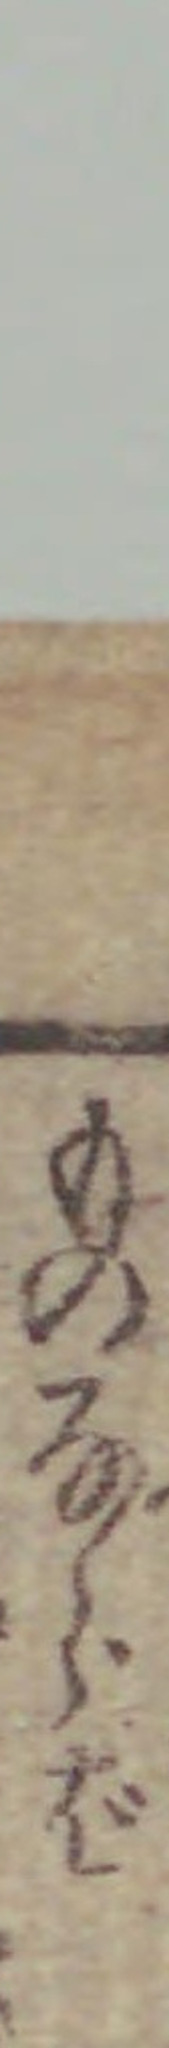ものならば
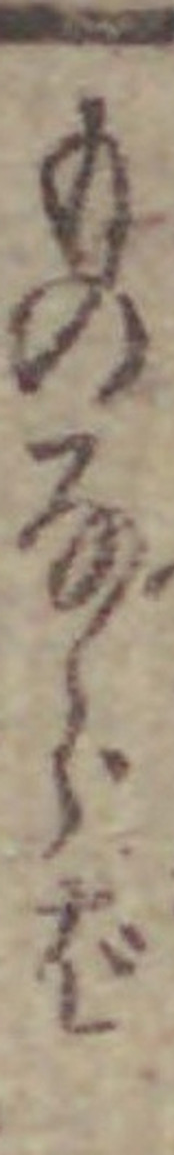ものならば
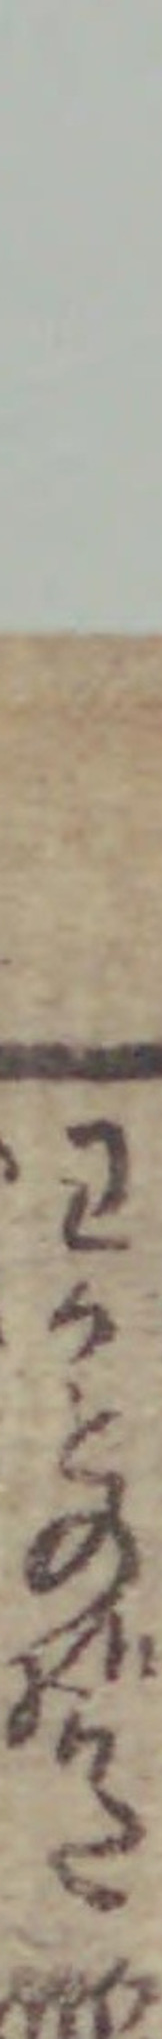わかとの様かた
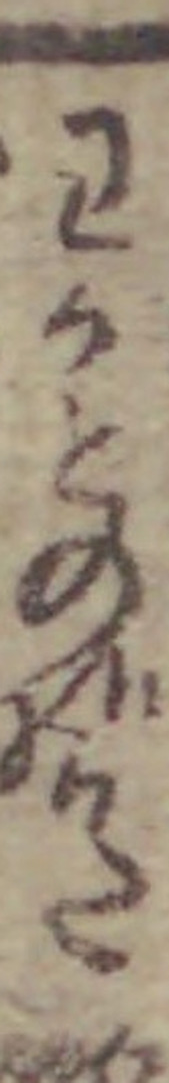わかとの様かた
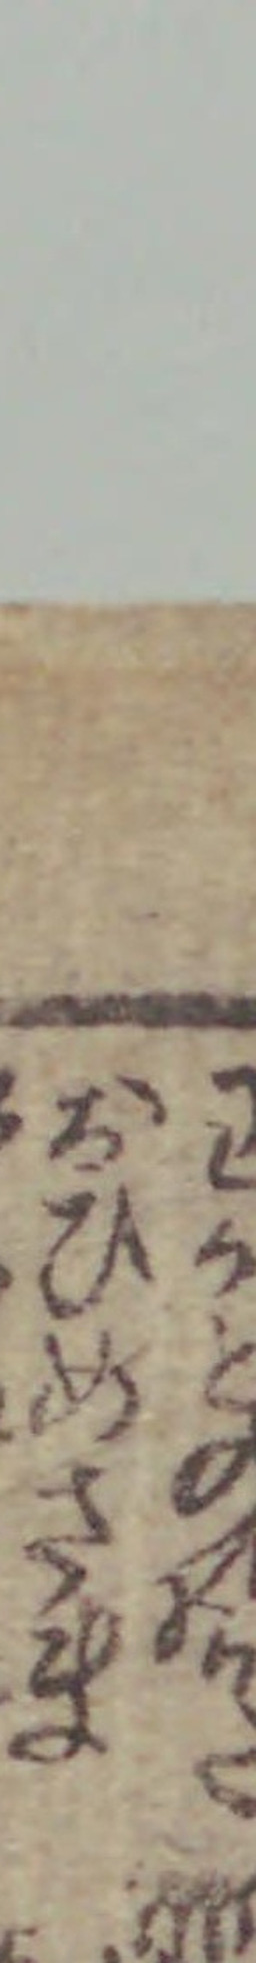おひめさま
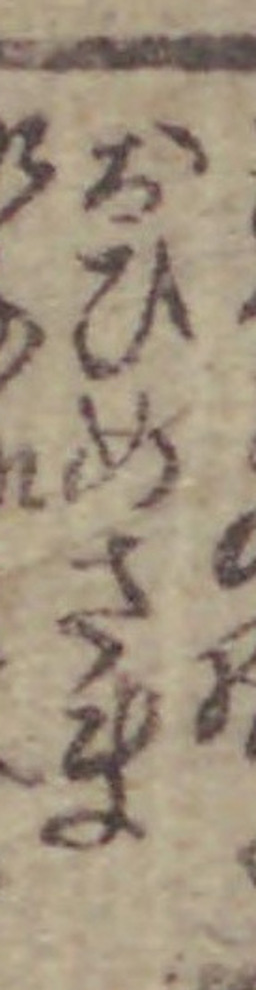おひめさま
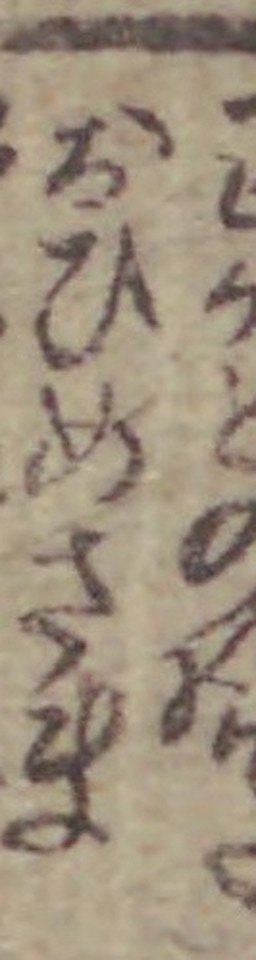おひめさま
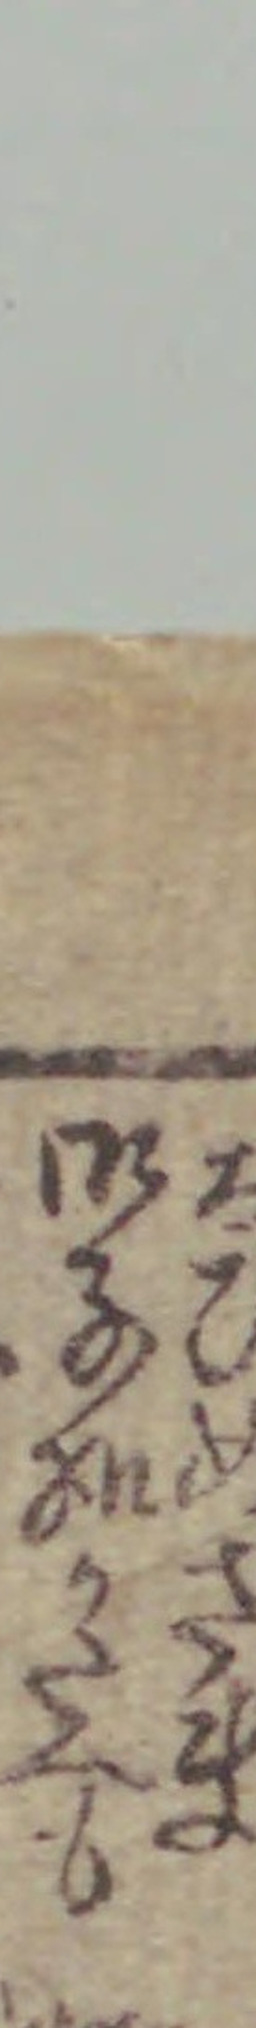御子様かたへも
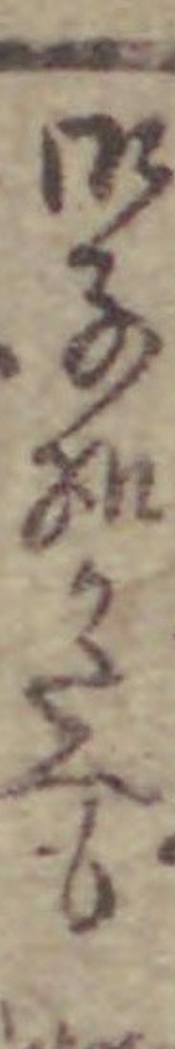御子様かたへも
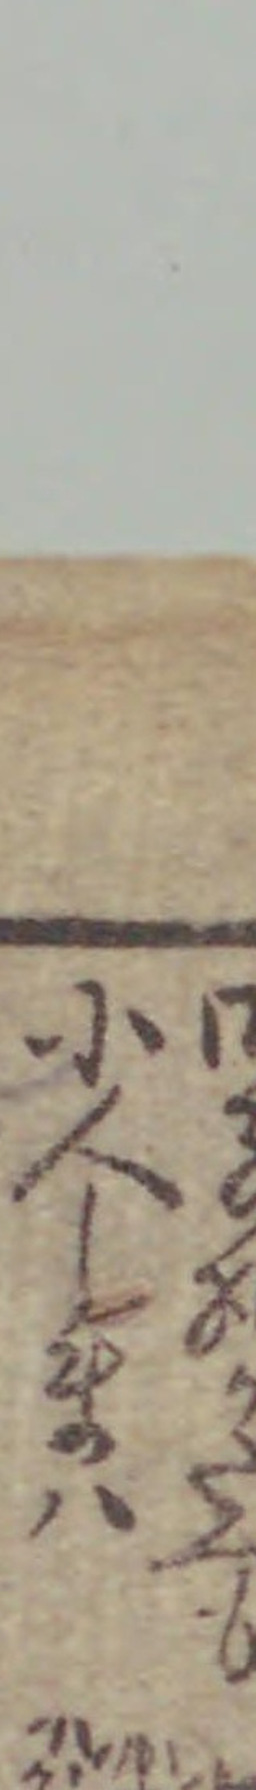小人しまは
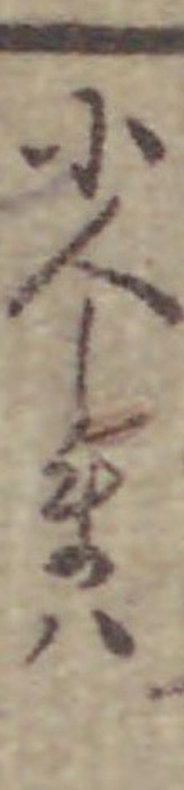小人しまは
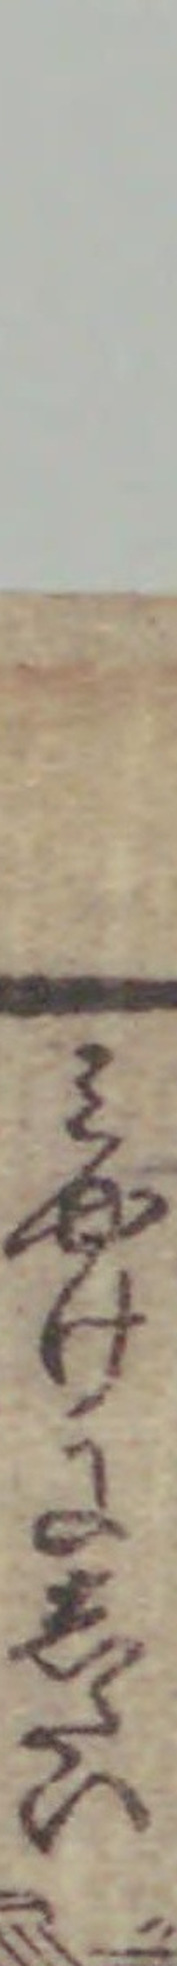みやけにしたい
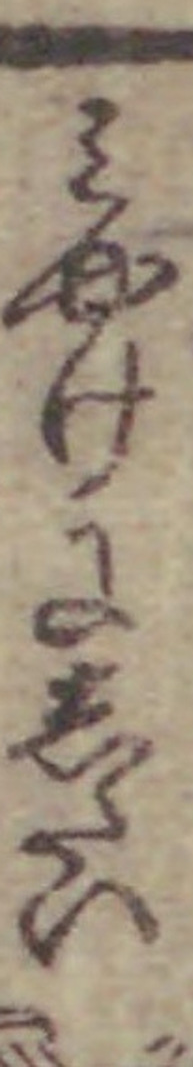みやけにしたい
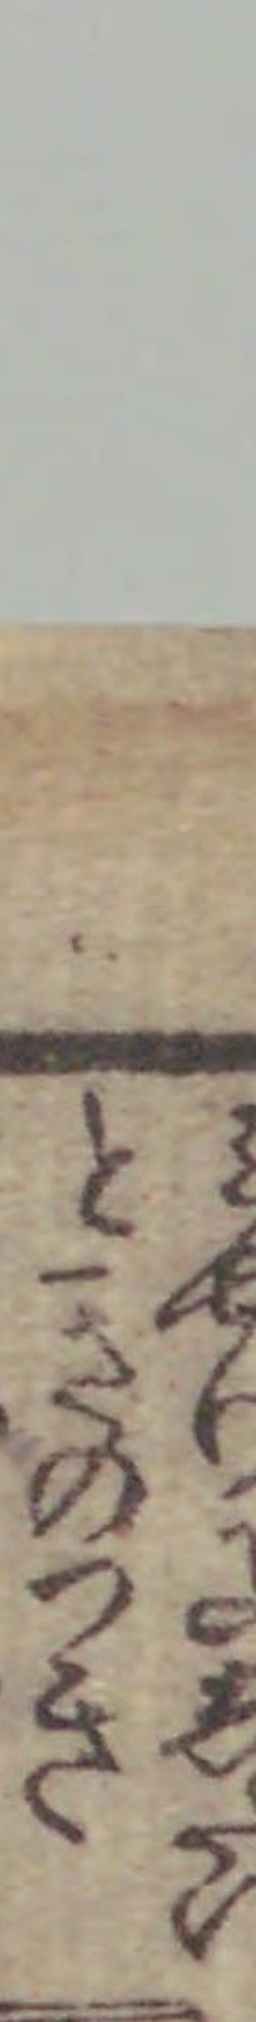ときのつき
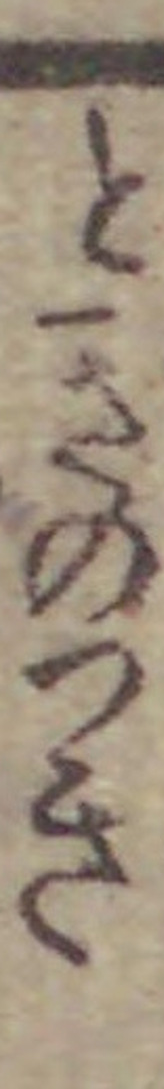ときのつき
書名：近頃嶋めぐり 3巻
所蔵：国立国会図書館 National Diet Library, JAPAN
